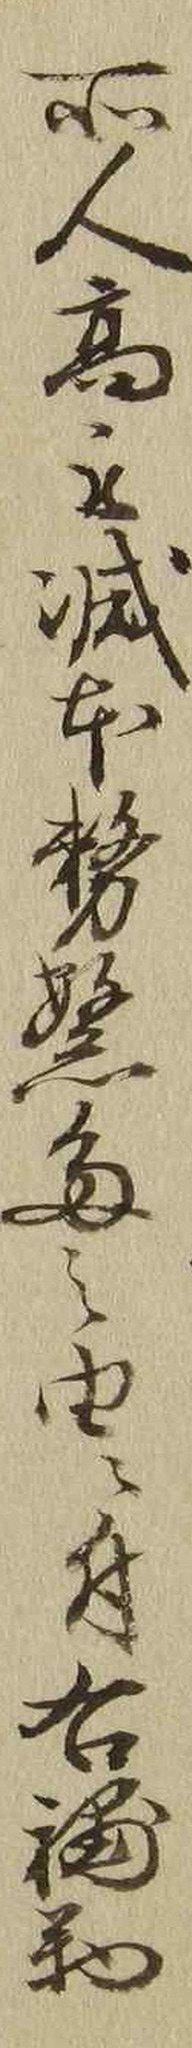所人高被減本務繫多之由ニ付右補勤
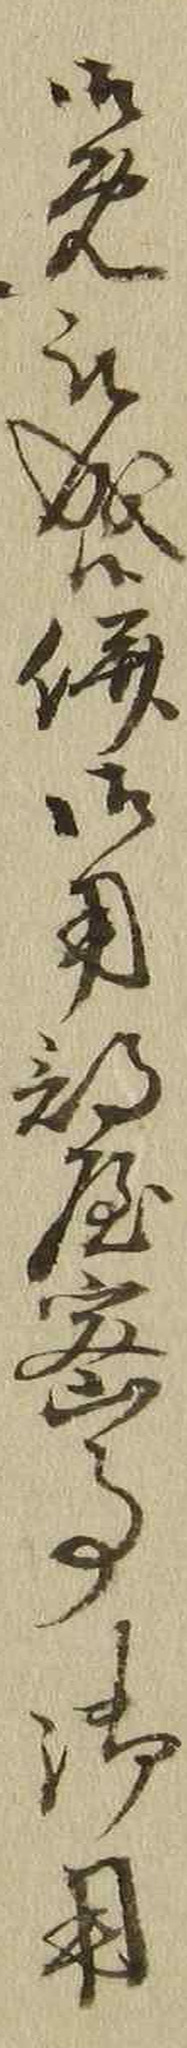御免被成候併御用部屋密事御用
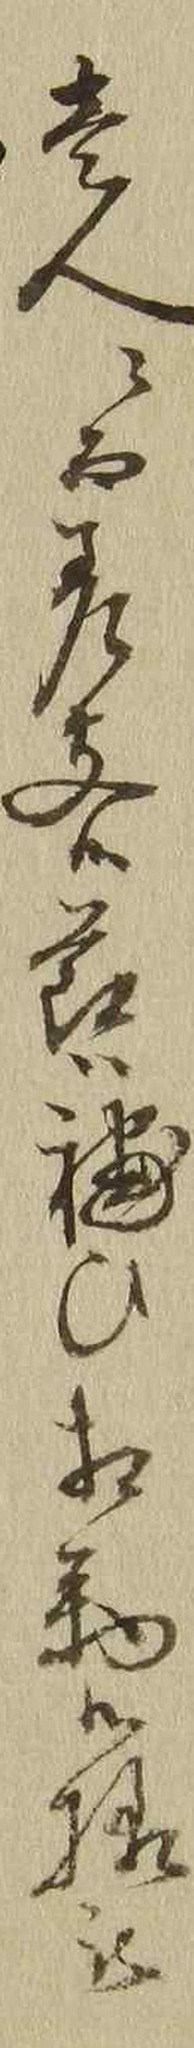壱人ニ而差支候節ハ補ひ相勤候様被
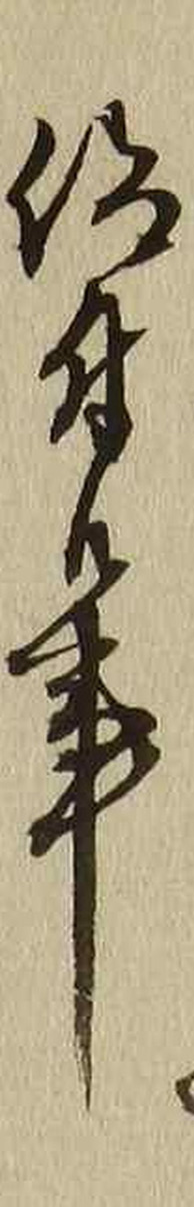仰付候事
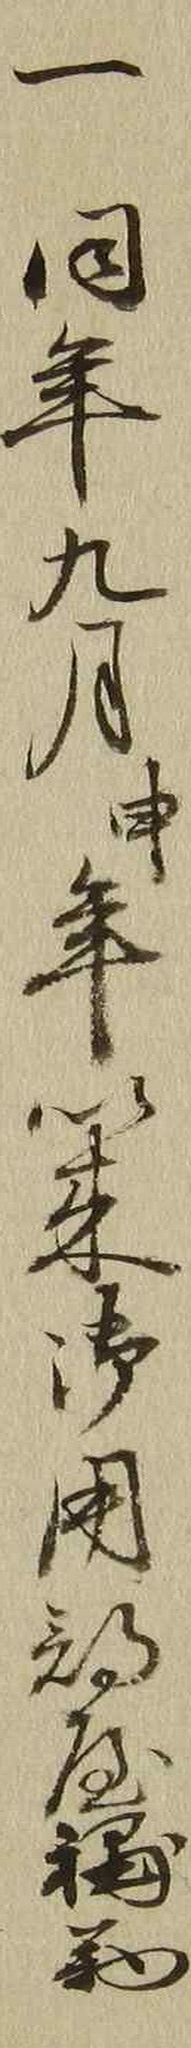一同年九月申年以来御用部屋補勤
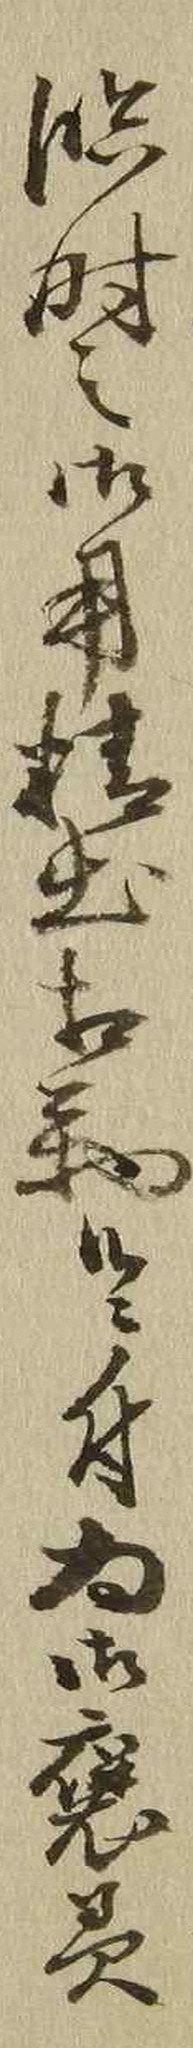臨時之御用精出相勤候ニ付為御褒美
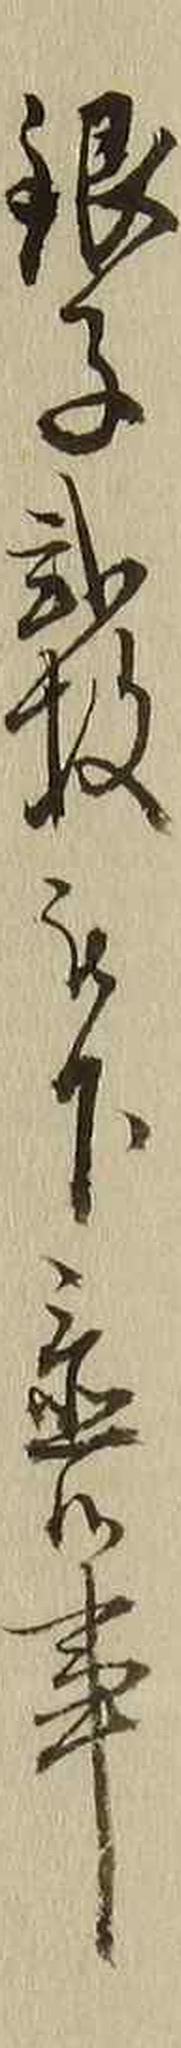銀子弐枚被下置候事
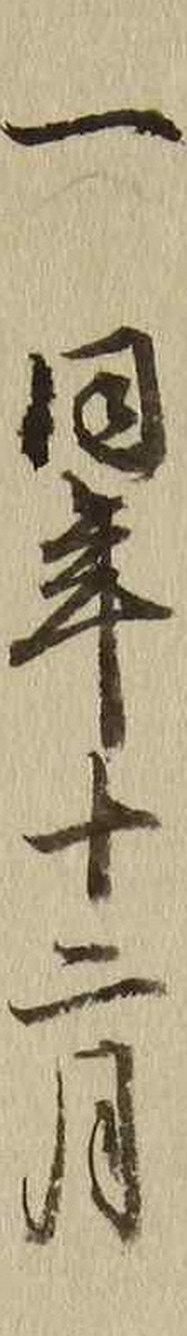一同年十二月
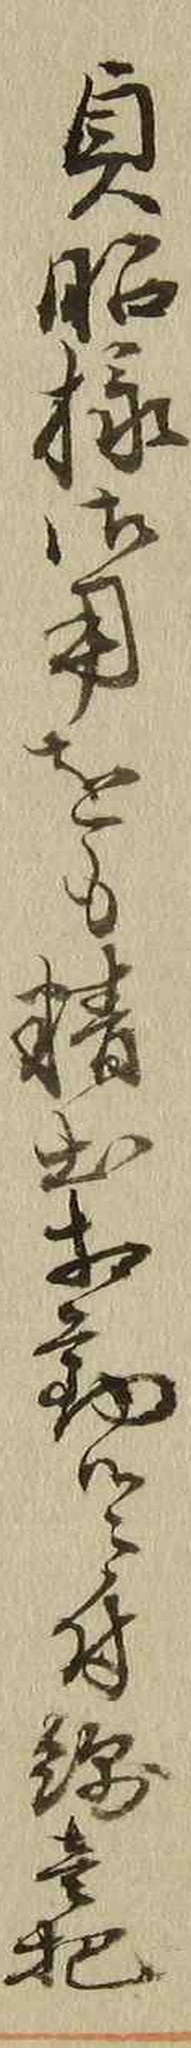貞昭様御用をも精出相勤候ニ付綿壱把
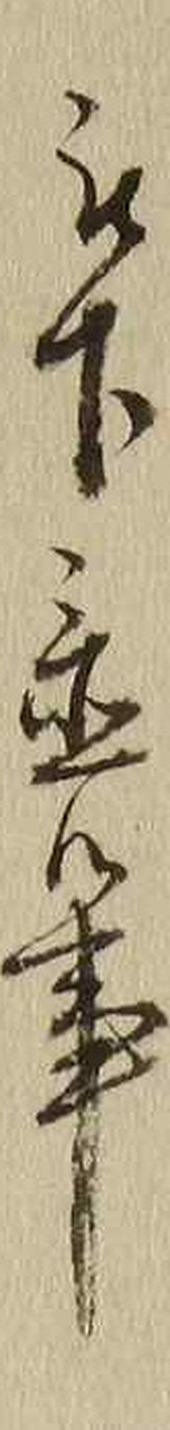被下置候事
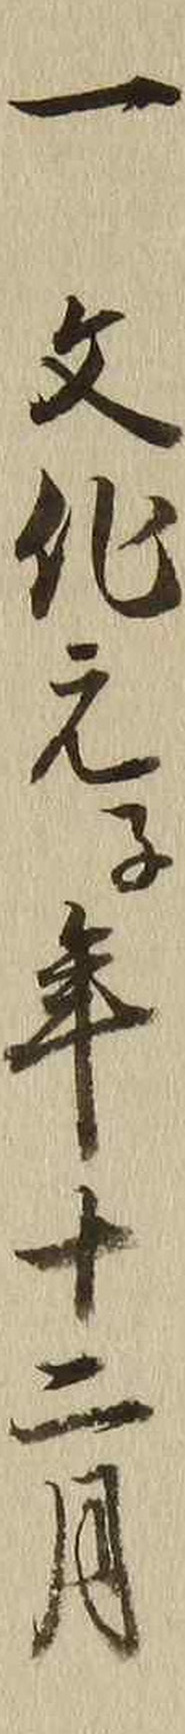一文化元子年十二月
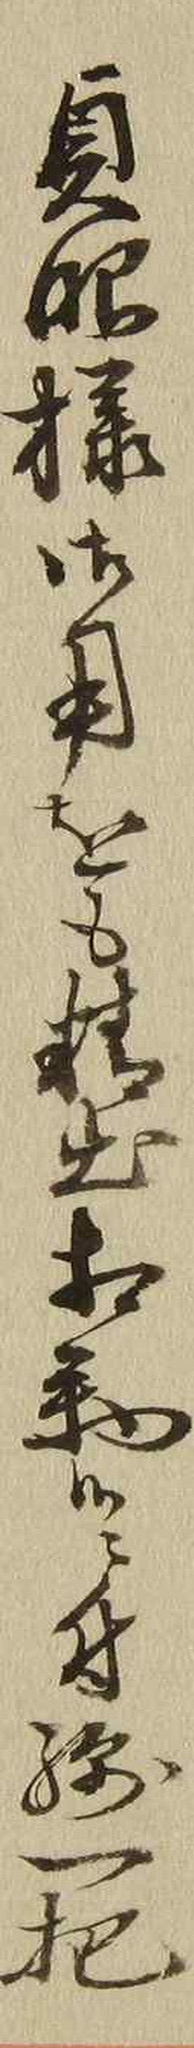貞昭様御用をも精出相勤候ニ付綿一把
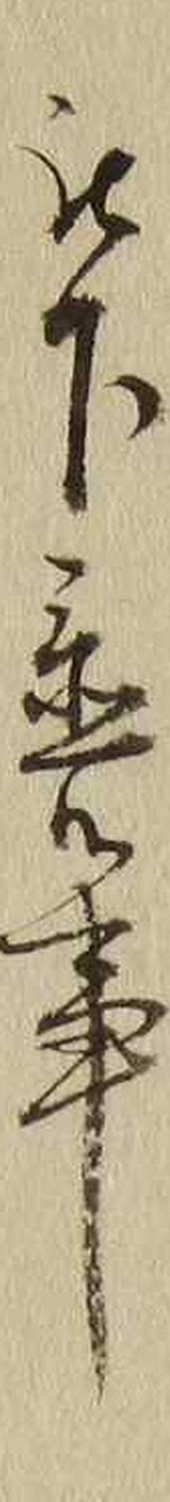被下置候事
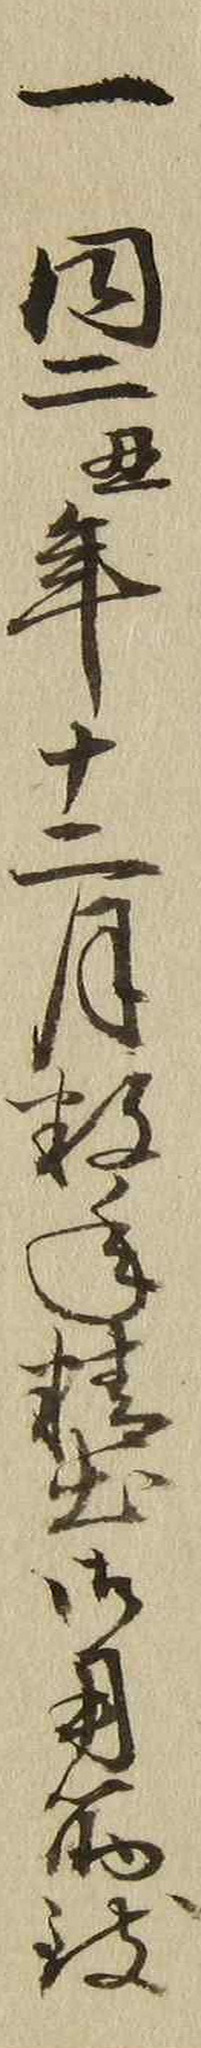一同二丑年十二月数年精出御用筋致
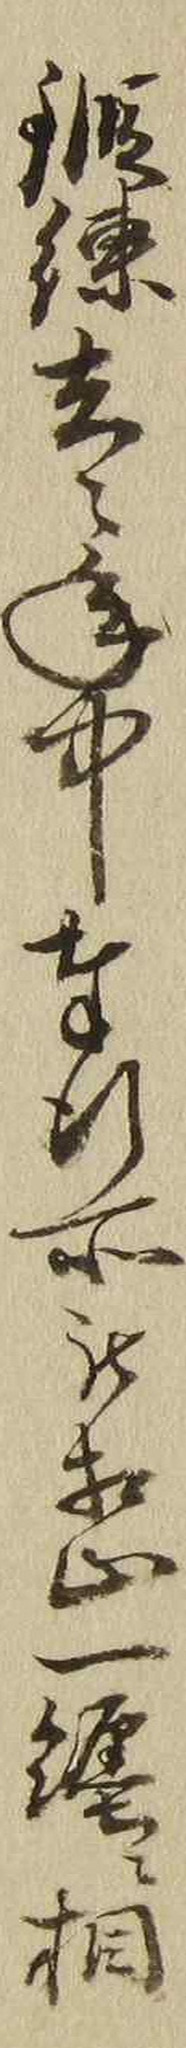鍛錬去々年中奉行所被相止一纏ニ相
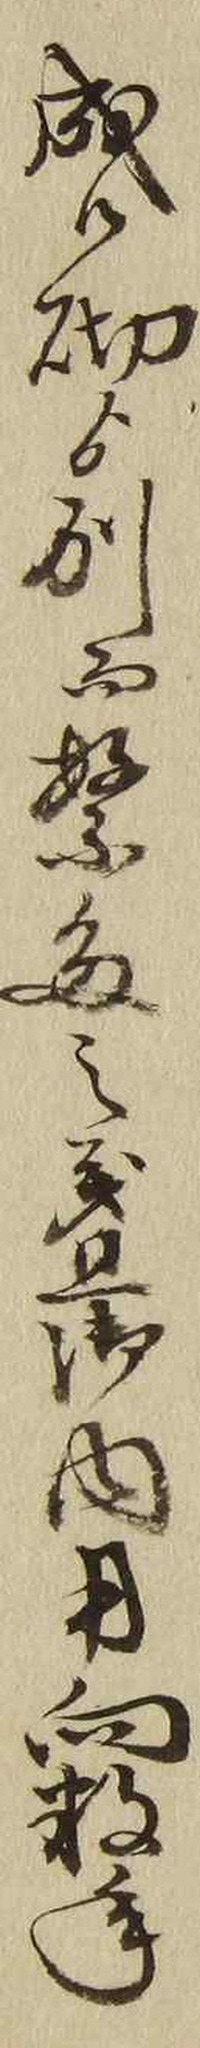成候砌ゟ別而繫多之義且御内用向数年
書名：諸士系譜　巻之64　と之部7
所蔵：会津若松市立会津図書館
